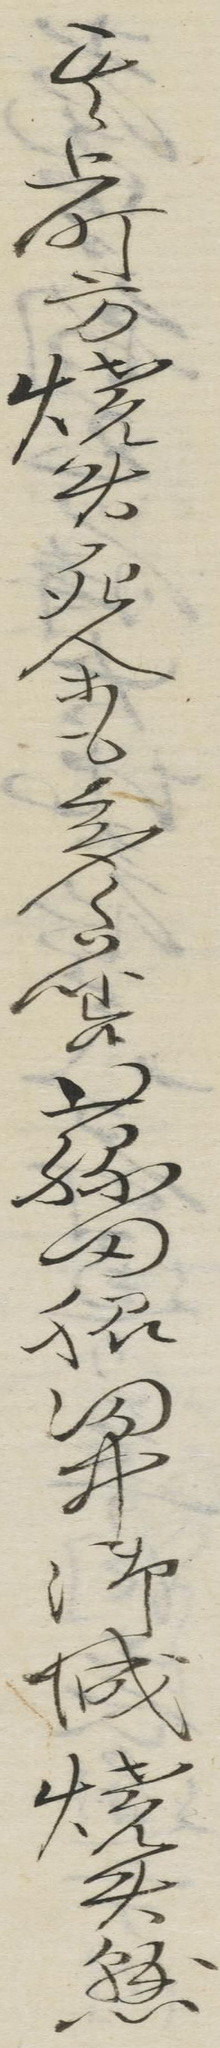其上町方焼失死人等も多く御座候菰田脇田中御城焼失熱
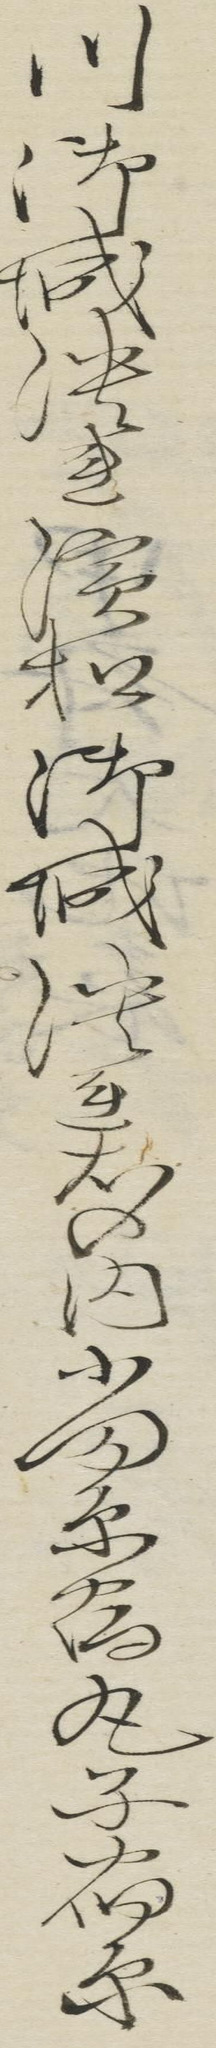川御城潰れ濱松御城潰れ右の内小田原宿丸子宿原
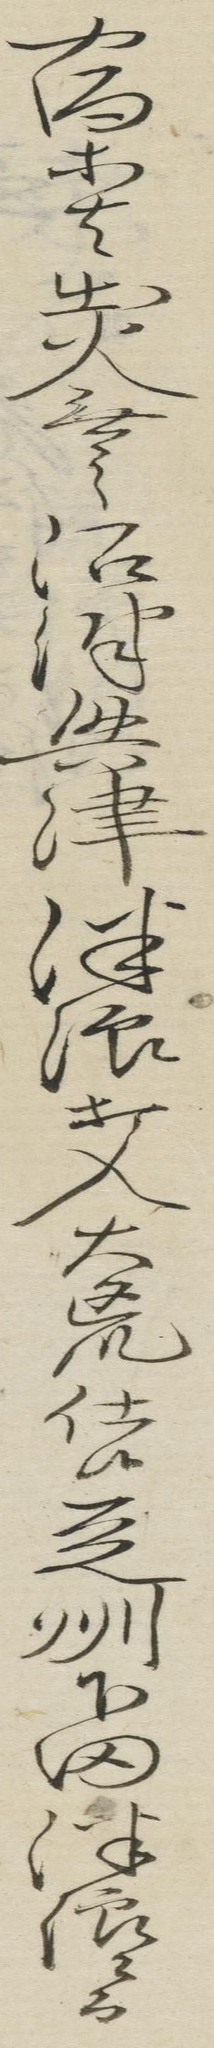宿等は出火無之沼津興津津浪打入大荒仕候豆州下田津浪ニ而
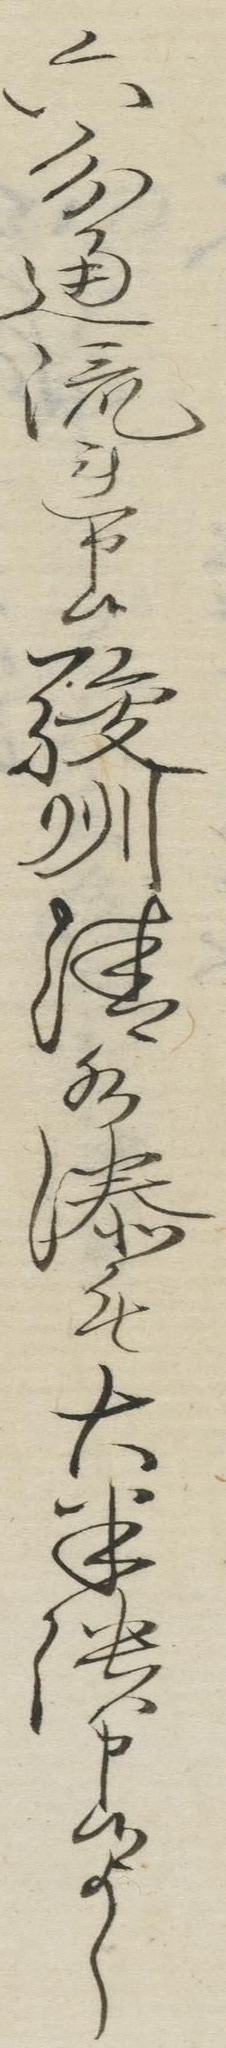六分通流れ申候駿州清水湊も大半潰申候よし
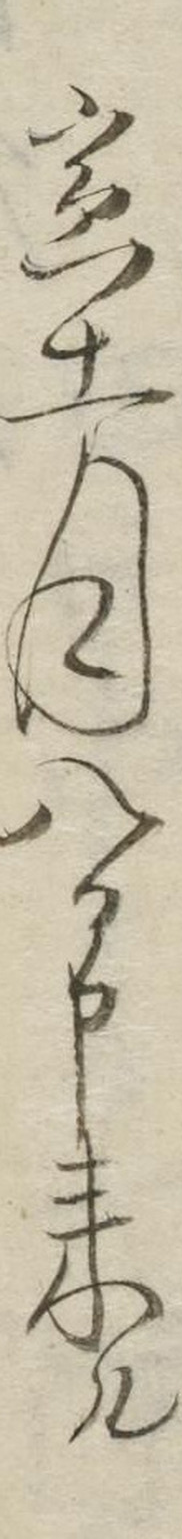寅十一月八日申来ル
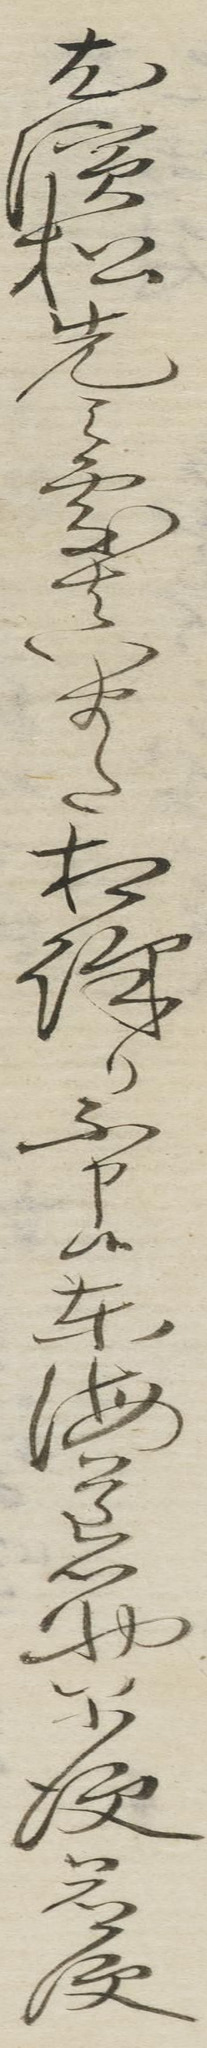尤濱松先之処はいまた相譯り不申候東海道筋ハ出便着便
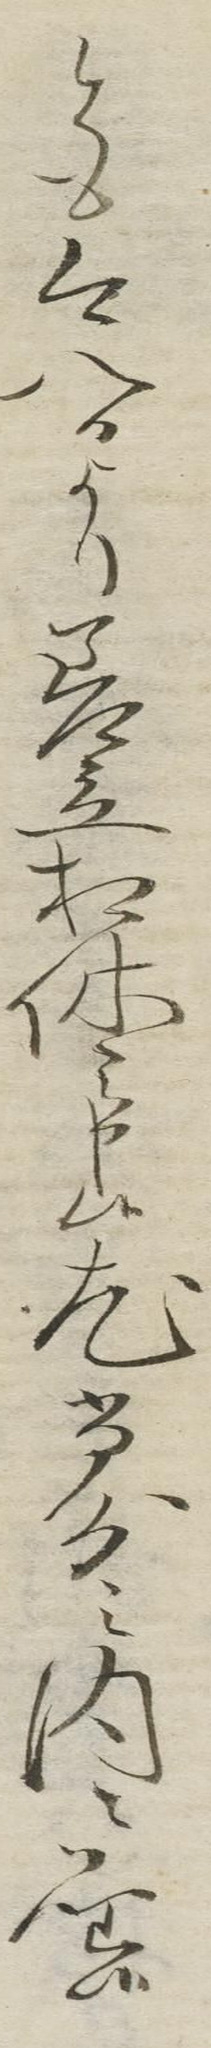とも今八日より差立相休ミ申候尤当分之内ニ御座候
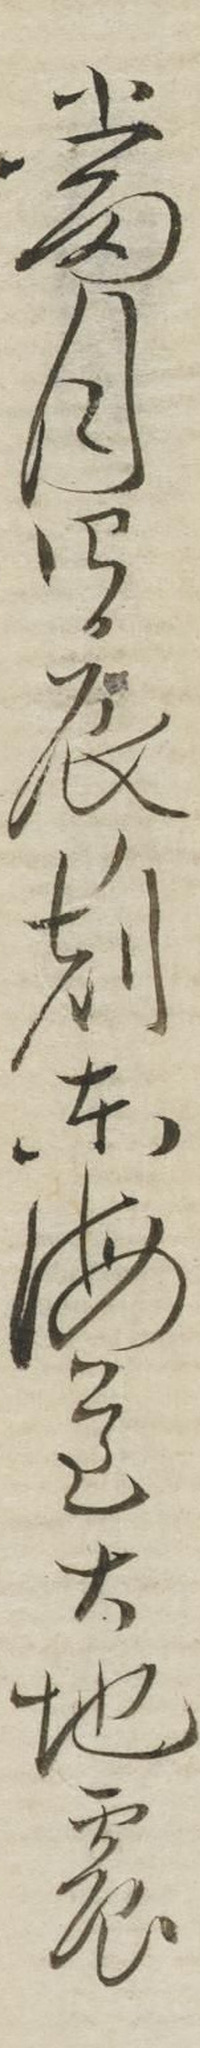当月四日辰ノ刻東海道大地震
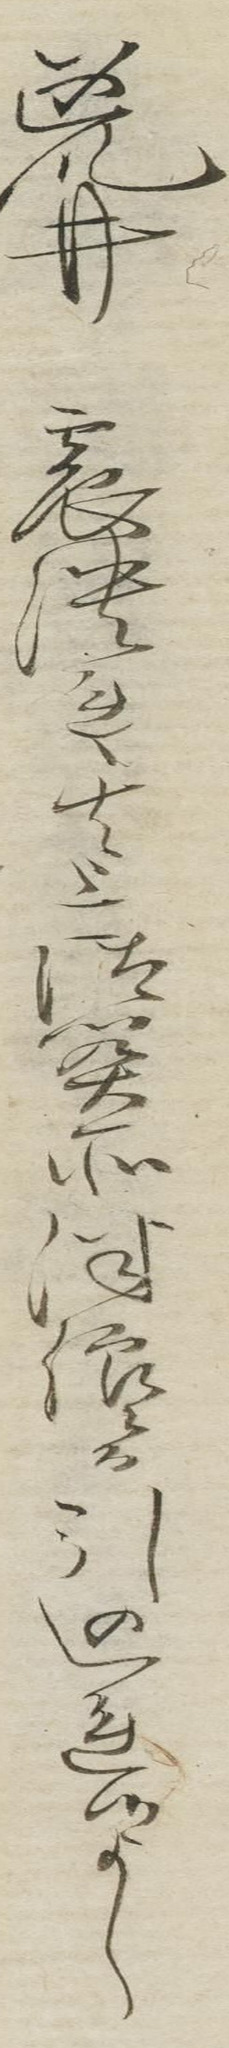荒井震潰れ其上御関所津浪ニ而引込れ候よし
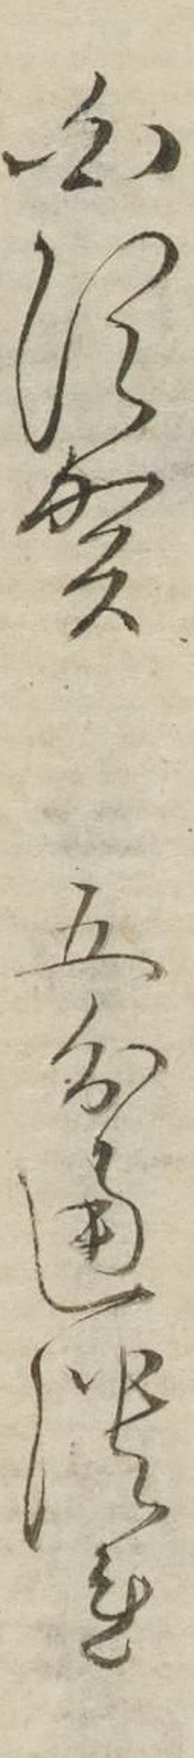白須賀五分通潰れ
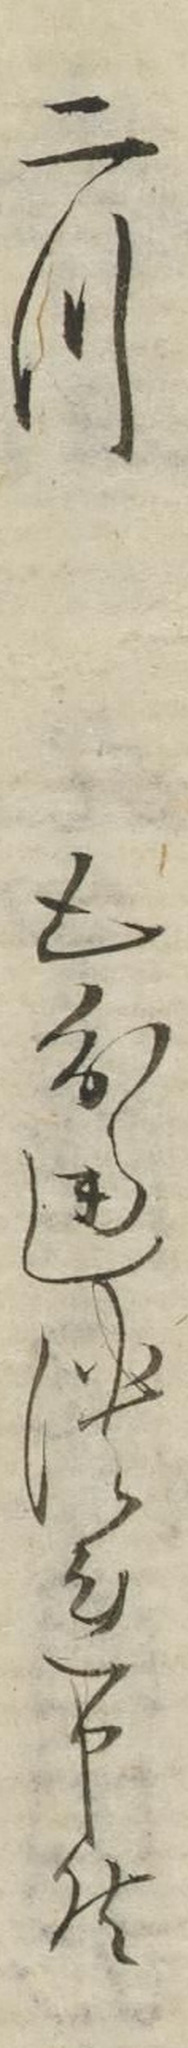二川五分通潰れ申候

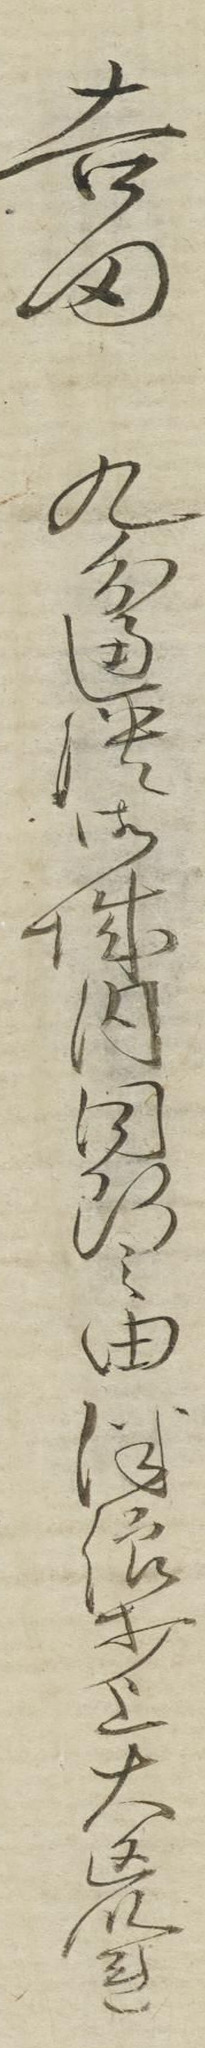吉田九分通潰御城内同断之由津浪打上大崩れ
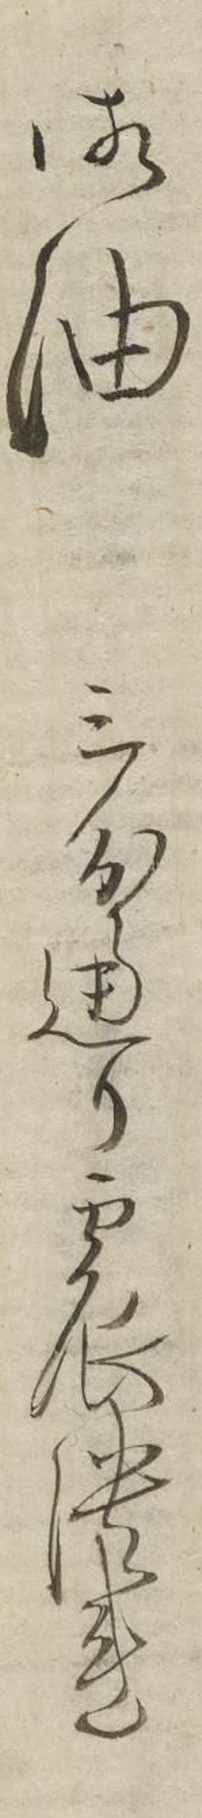御油三分通り震潰れ
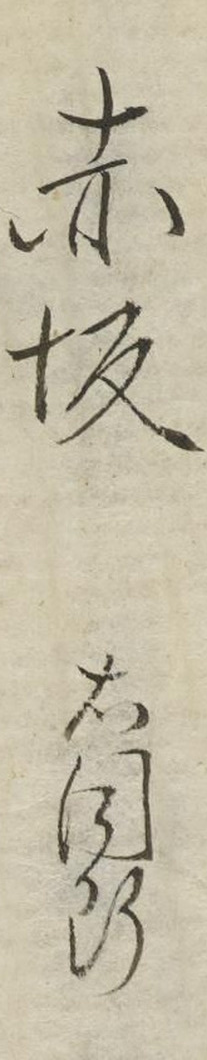赤坂右同断
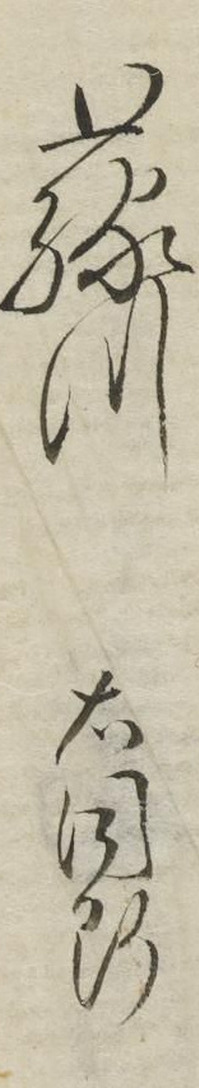藤川右同断
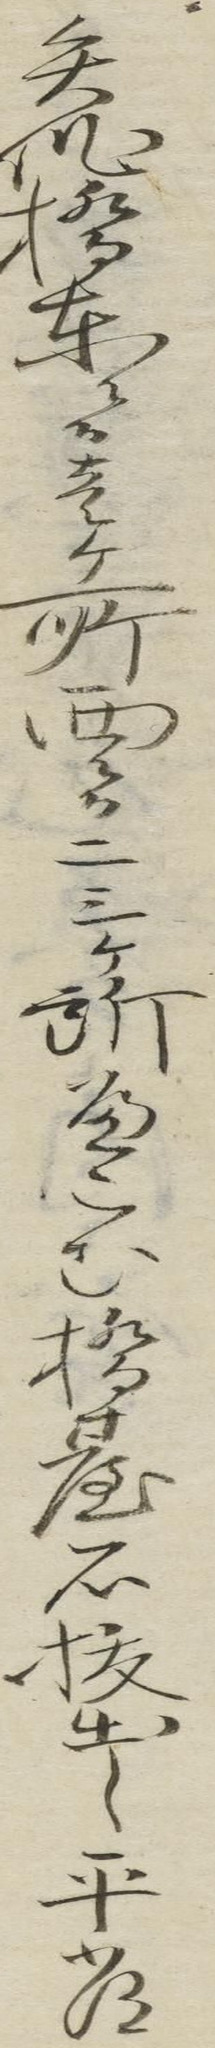岡崎矢作橋東ニ而壱ケ所西ニ而二三ケ所へこむ橋台石抜出し平常
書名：大地震實録
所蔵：東京大学地震研究所図書室 Earthquake Research Institute Library, The University of Tokyo, JAPAN
